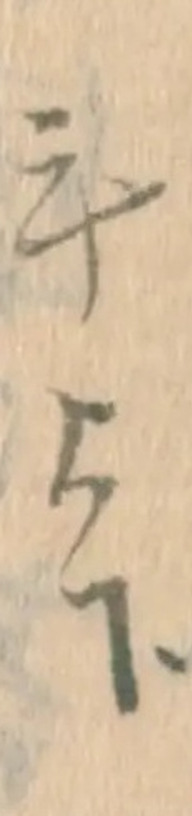計被下
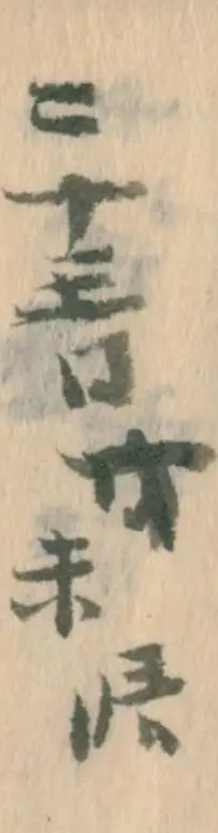二十三日丁未晴
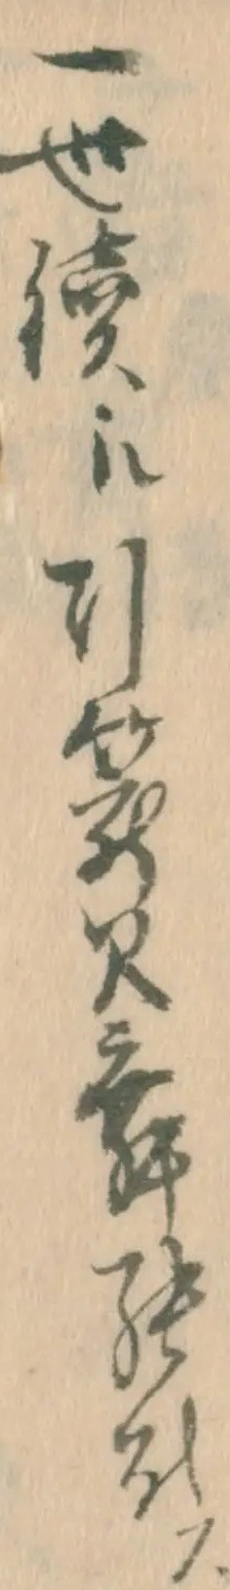一世続え引籠見舞罷越ス
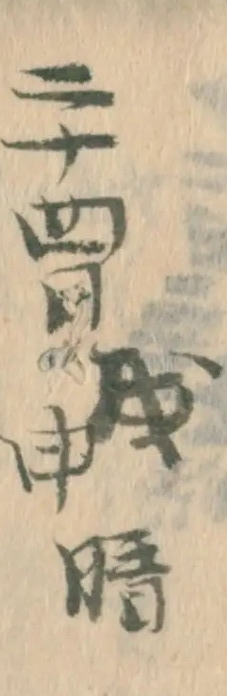二十四日戊申晴
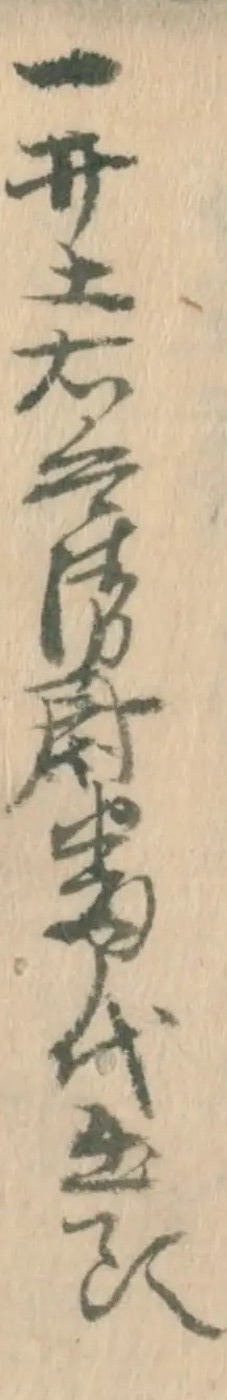一井上右兵衛尉番代出頭
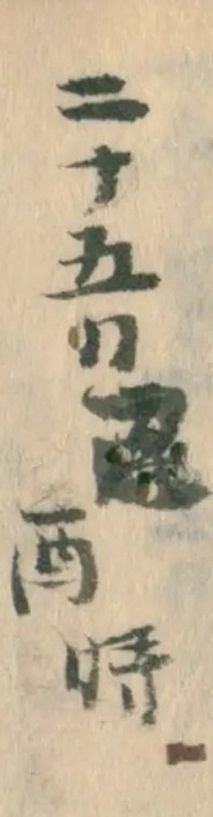二十二日丙午晴

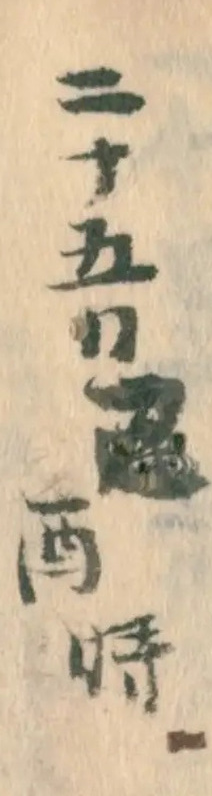二十五日己酉晴
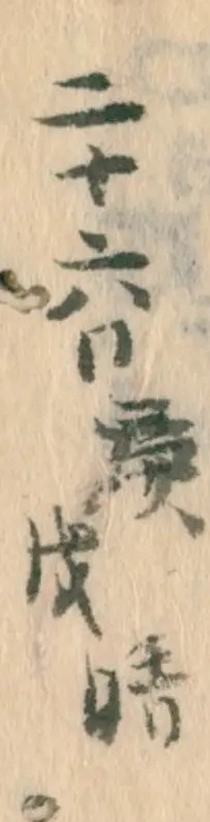二十六日庚戌晴
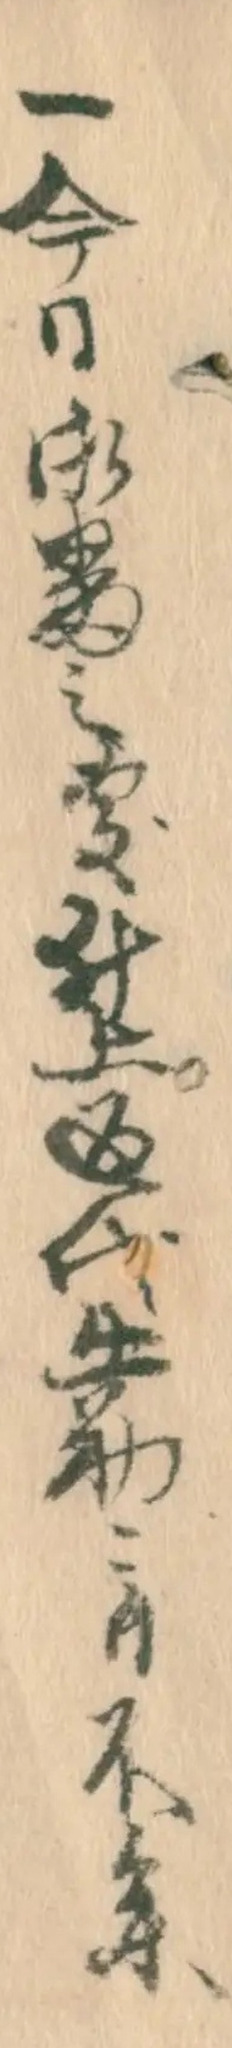一今日御番之処井上返代出勤ニ付不参
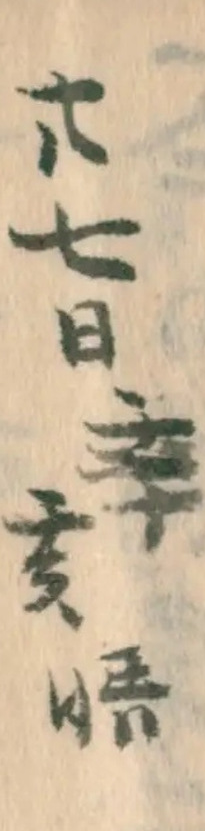廿七日辛亥晴
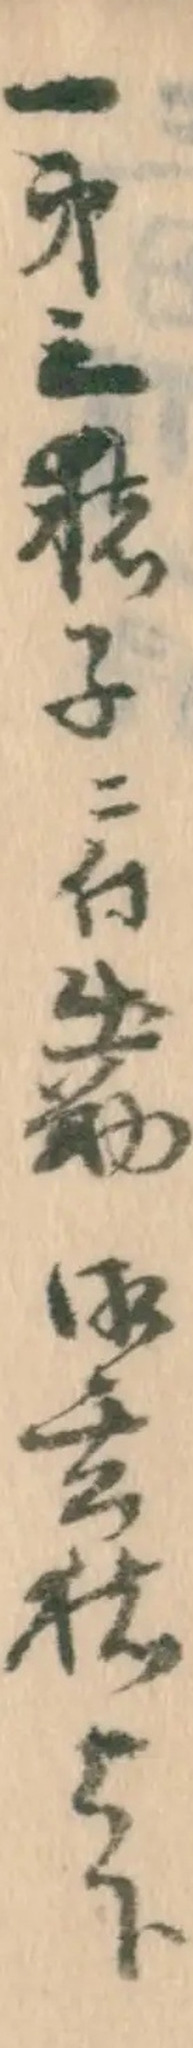一第三猪子ニ付出勤御玄猪被下
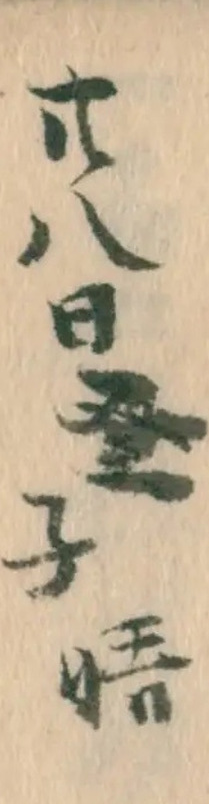廿八日壬子晴
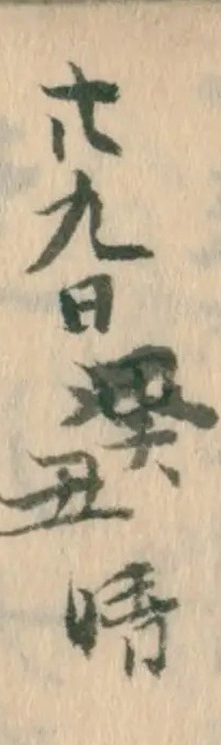廿九日癸丑晴
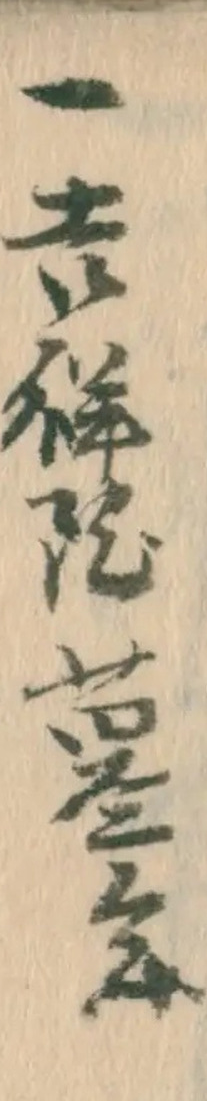一吉祥院墓参
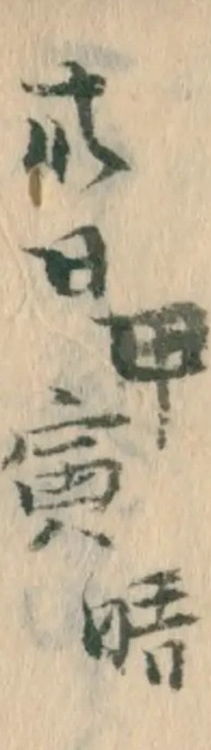卅日甲寅晴

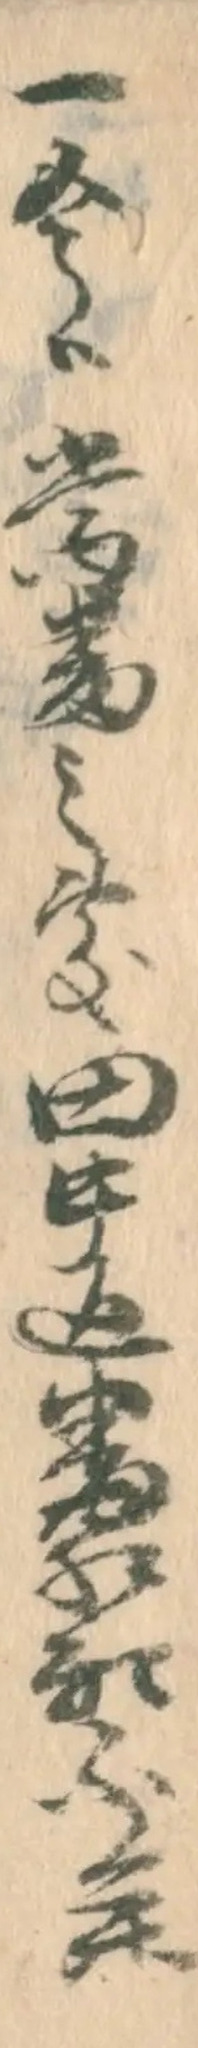一今日当番之処田中返番相頼不参
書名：禁裏御所御用日記. [131]
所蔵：国立国会図書館 National Diet Library, JAPAN
